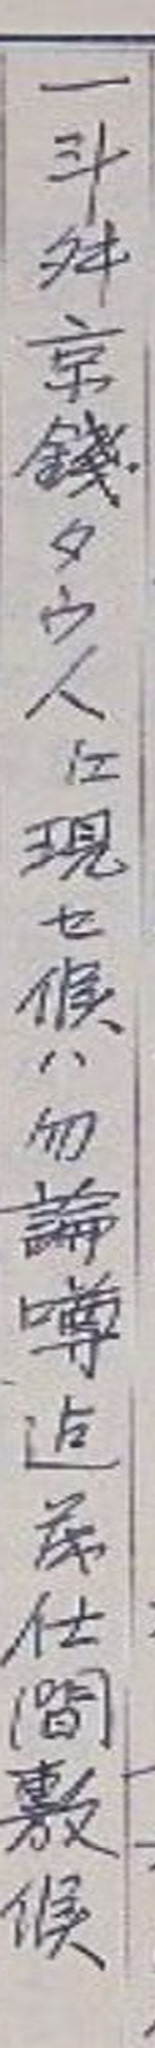一斗舛京銭たう人え現せ候は勿論噂迄も仕間敷候
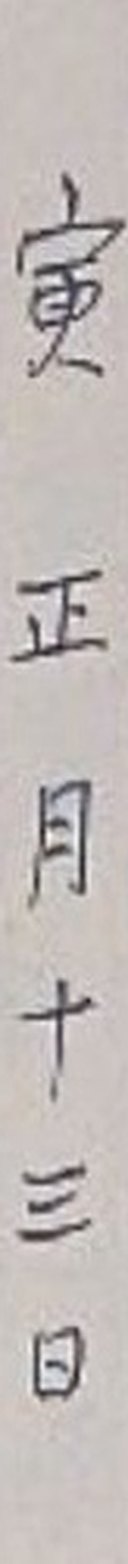寅正月十三日
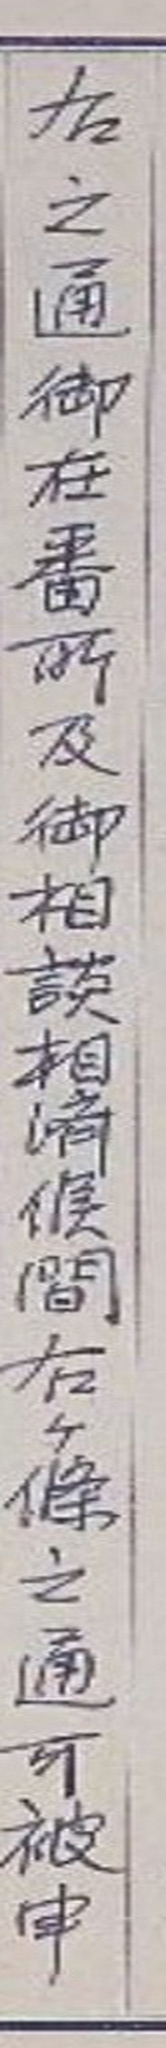右之通御在番所及御相談相済候間右ヶ条之通可被申
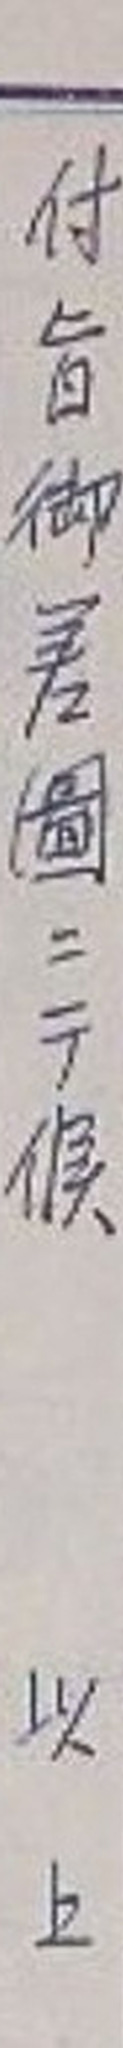付旨御差図にて候以上
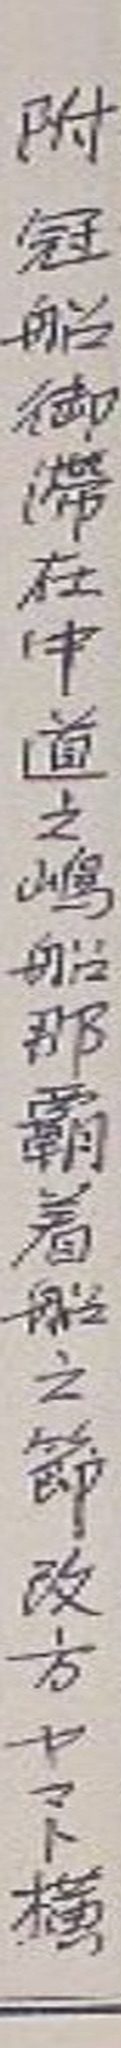附冠船御滞在中道之島船那覇着船之節改方やまと横
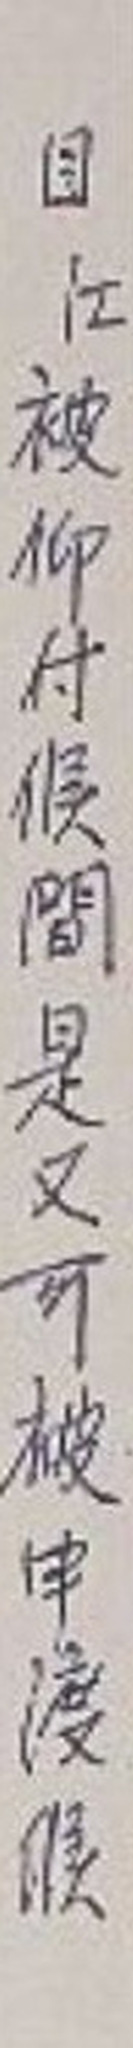目え被仰付候間是又可被申渡候
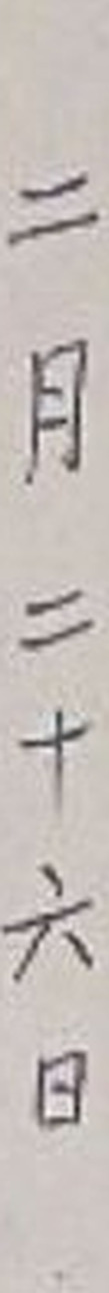寅二月二十六日
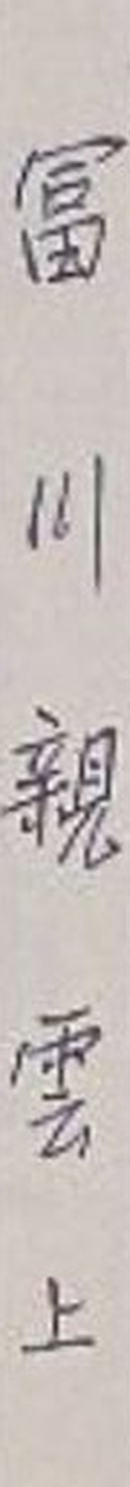冨川親雲上
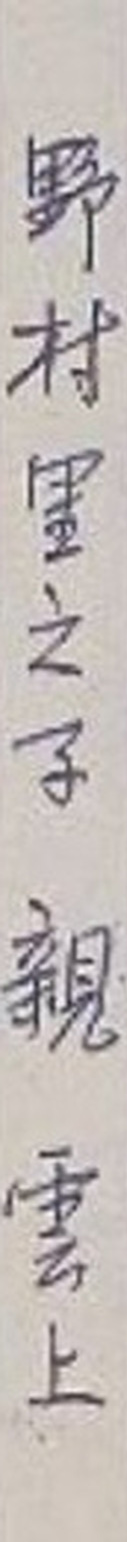野村里之子親雲上
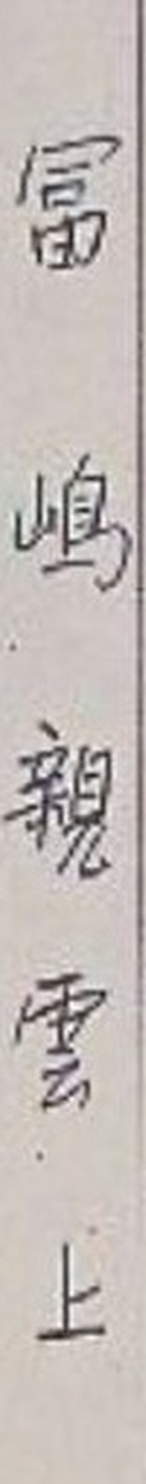冨島親雲上
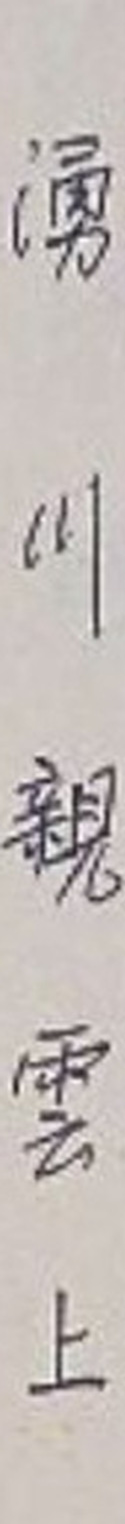湧川親雲上
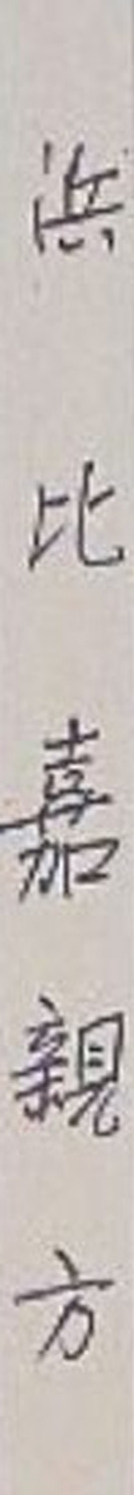浜比嘉親方
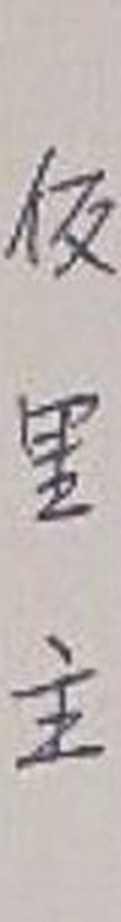仮里主

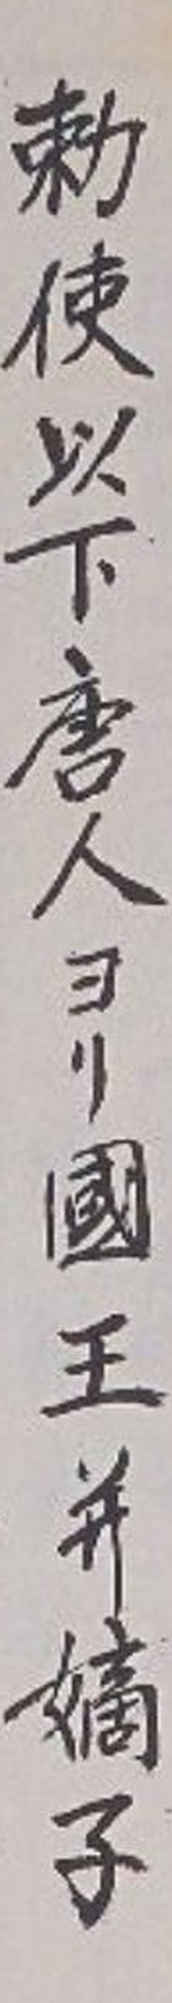勅使以下唐人より国王并嫡子
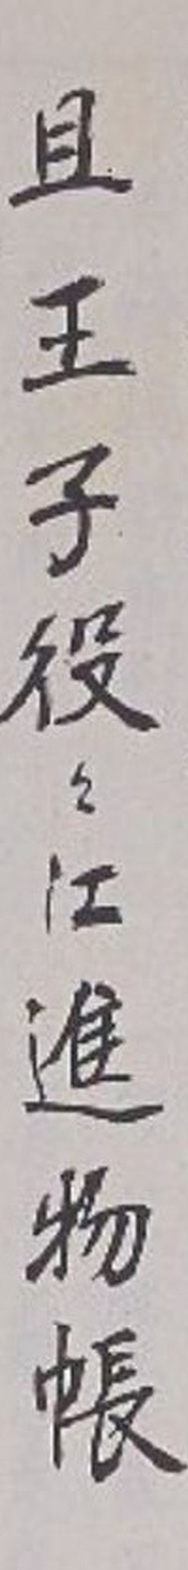且王子役々え進物帳

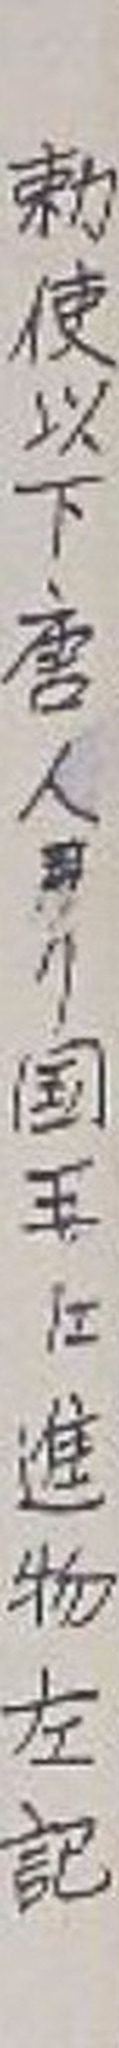勅使以下唐人より国王え進物左記
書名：支那冊封使来琉諸記 下巻
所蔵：University of the Ryukyus Library
